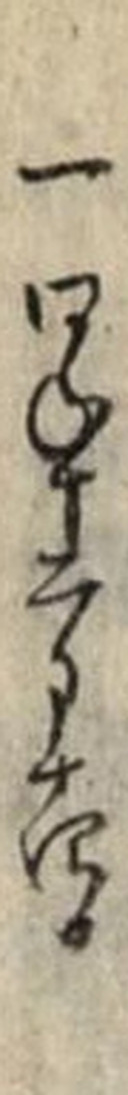一同年十二月十四日
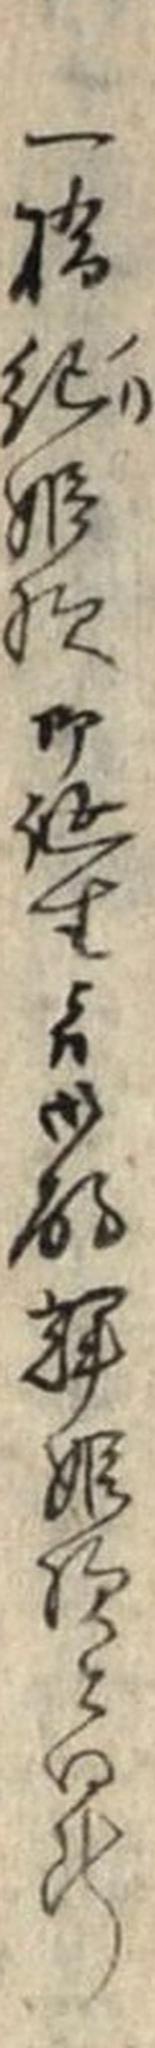一橋紀姫様御誕生に付御触輝姫様と同断
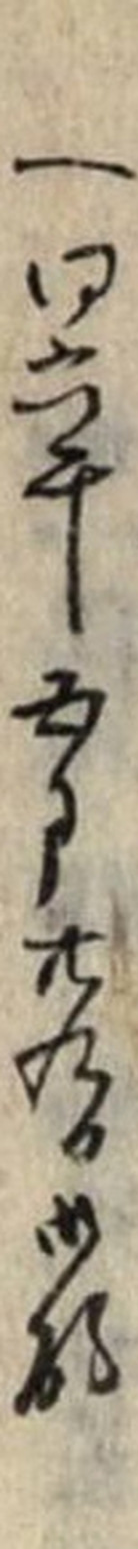一同六午五月廿九日御触
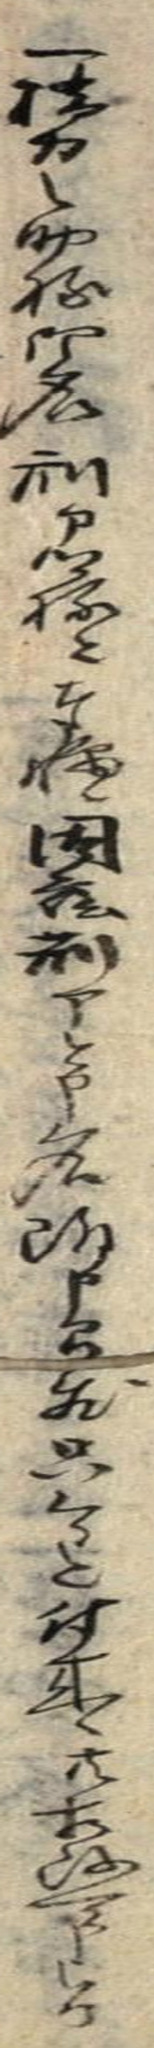一橋力之助様御名刑部卿様と奉称候同名刑部と申名附申間敷只今迄付来候共相改可申旨
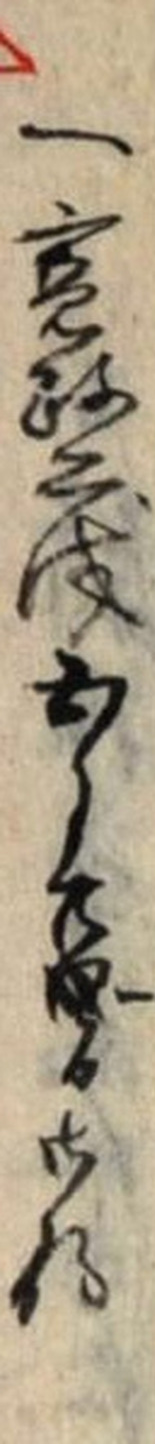一寛政二戌五月廿四日御触

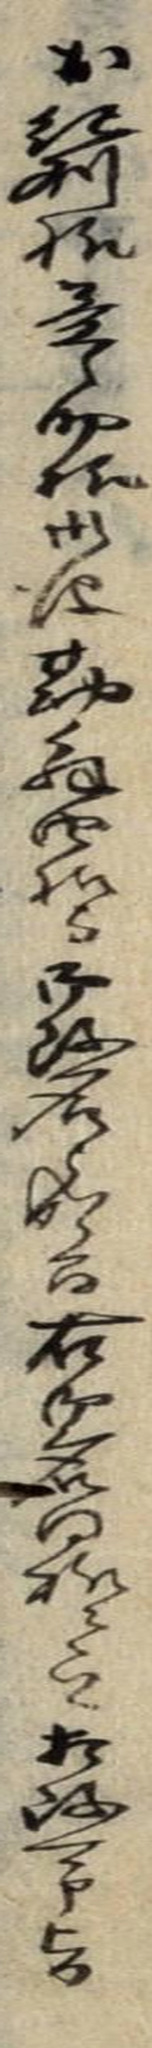於紀州様益之助様御儀勘解由様と御改名被成候間右御名同様に候はゝ相改可申旨
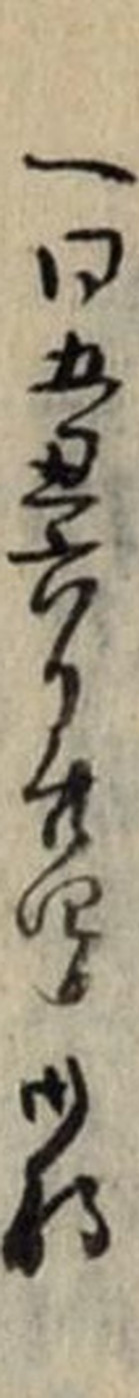一同五丑六月廿四日御触
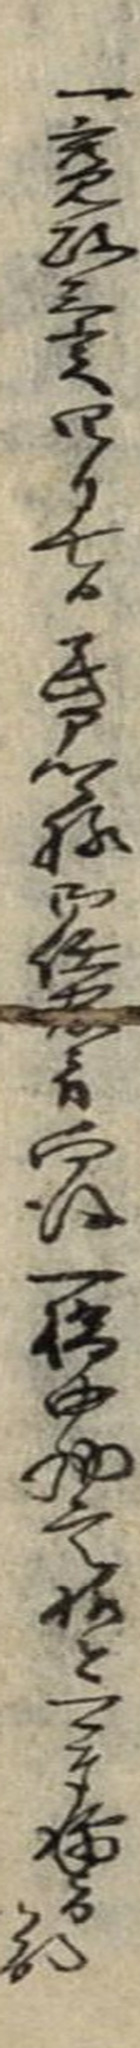一寛政三亥四月七日民部卿様御任官に付向後一橋中納言様と可奉称旨御触
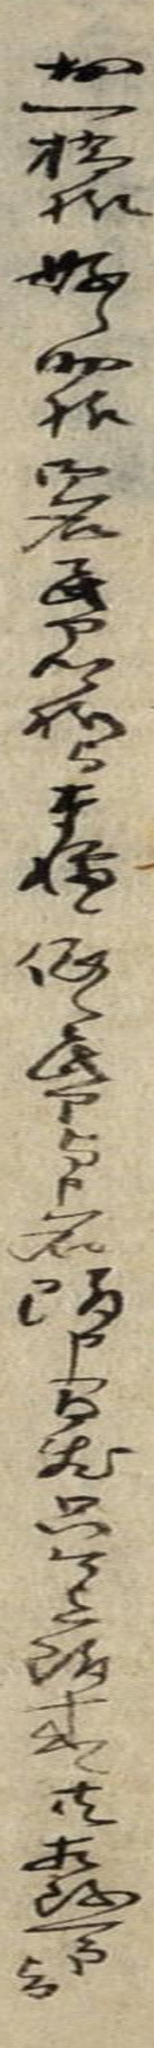於一橋様好之助様御名民部卿様と奉称候依之民部と申名附申間敷尤只今迄附来候共相改可申旨
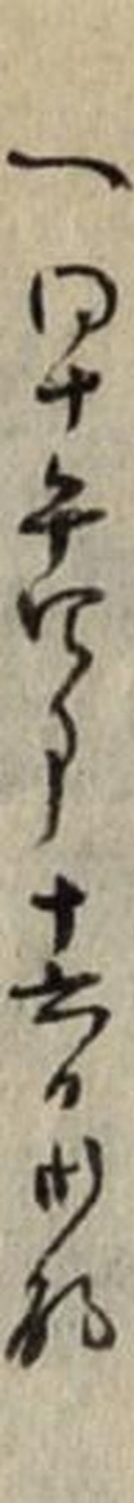一同十午四月十六日御触
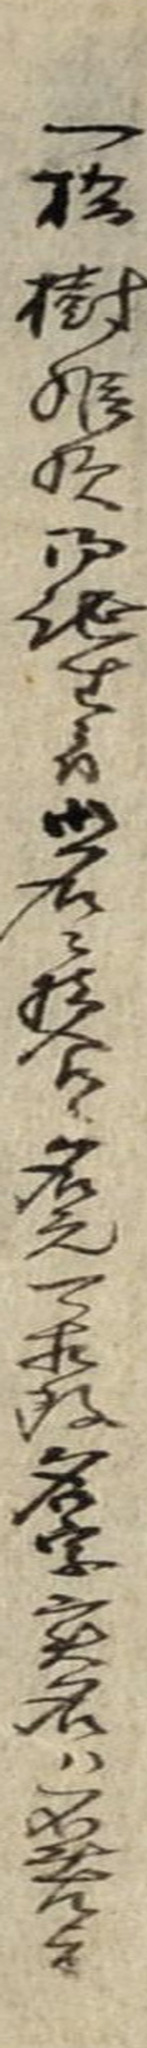一橋樹姫様御誕生に付御名に指合候名元可相改名字実名は不苦旨
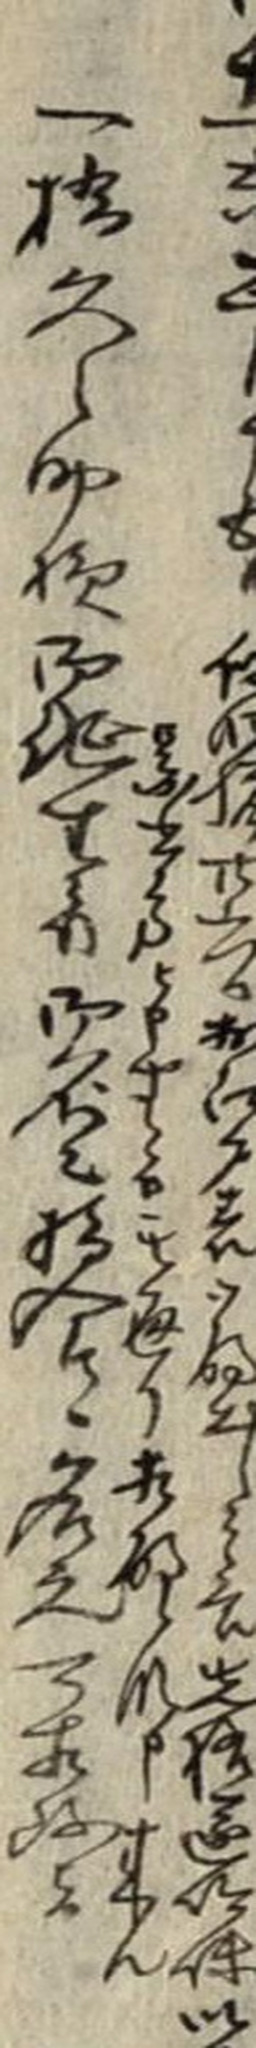一橋久之助様御誕生に付御名に指合候名元可相改旨
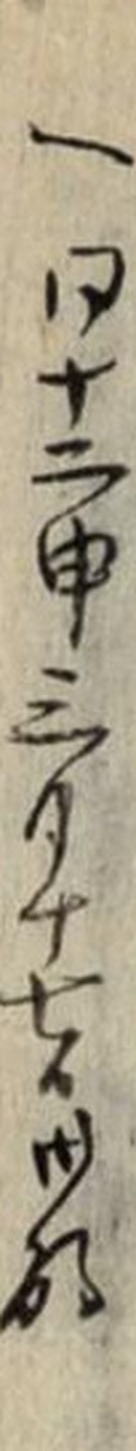一同十二申三月十七日御触
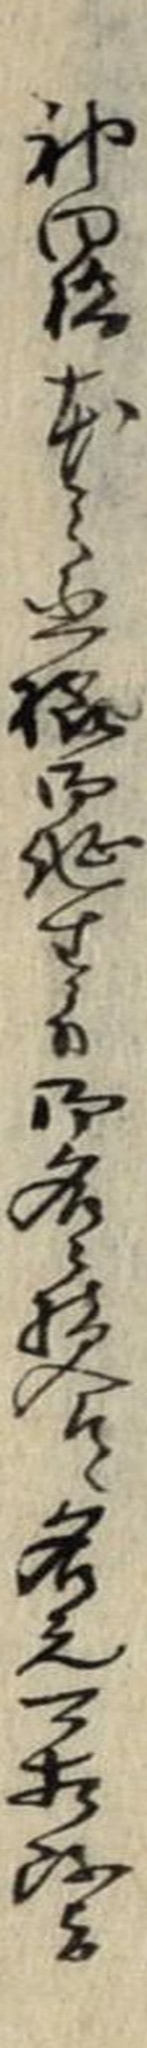神田橋本之丞様御誕生に付御名に指合候名元可相改旨
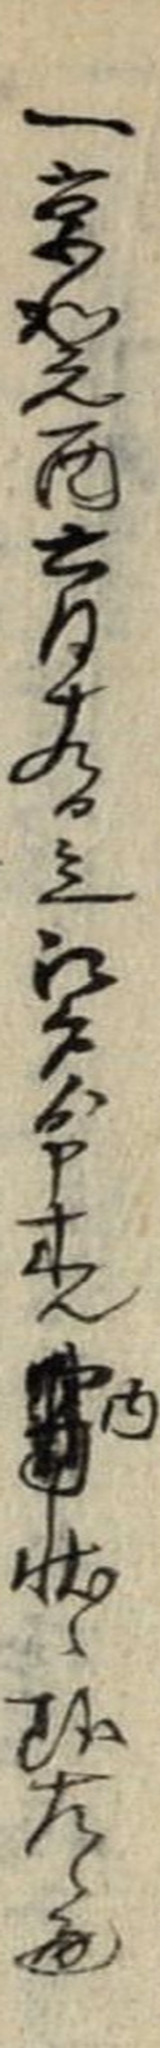一享和元酉七月十九日立江戸ゟ申来る内状之趣左之通
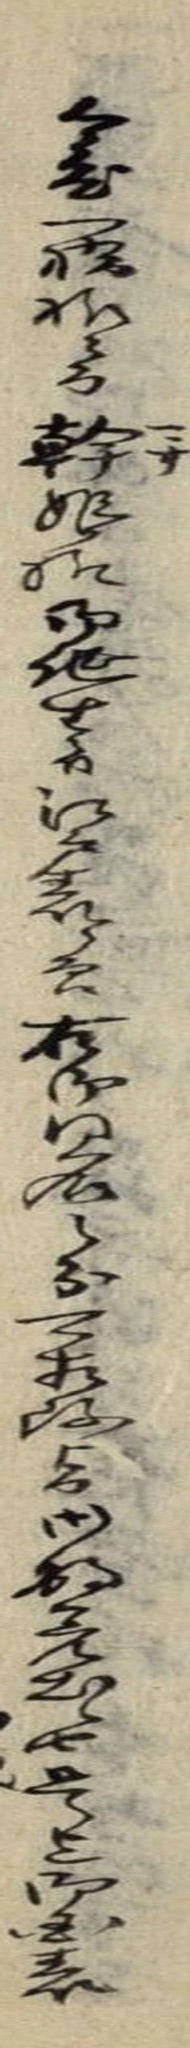今度一橋様に而幹姫様御誕生に付江戸表に而は右御同名之分可相改旨御触差出候由是迄御国表
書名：蒐輯之部
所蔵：福井県文書館 Fukui Prefectural Archives
